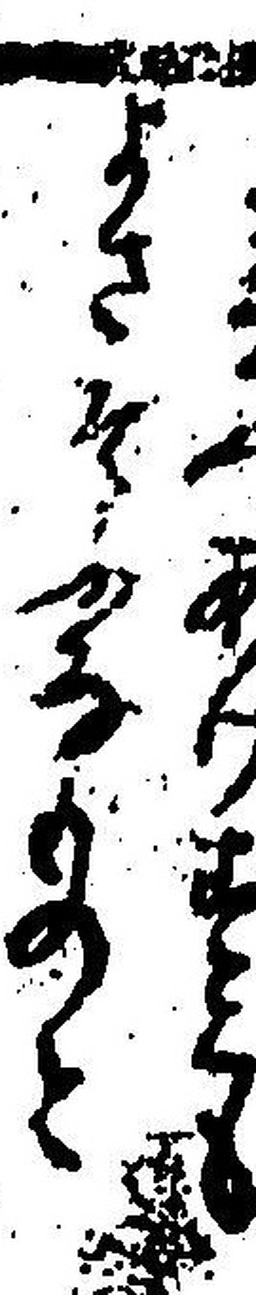よさそふなものと
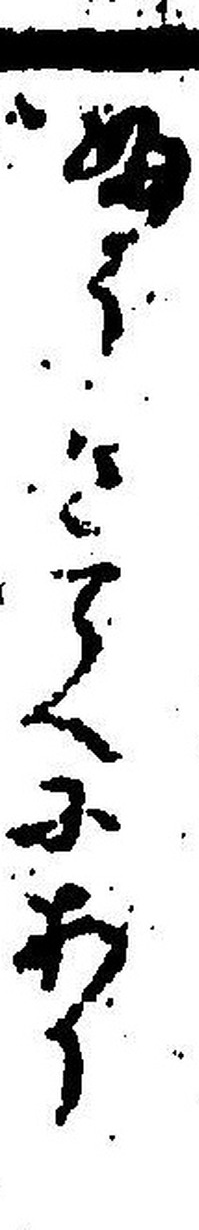ふうきてんにあり
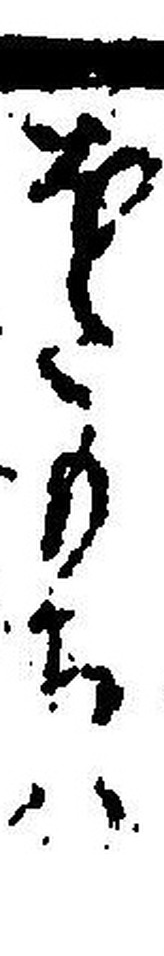ぼたもちは
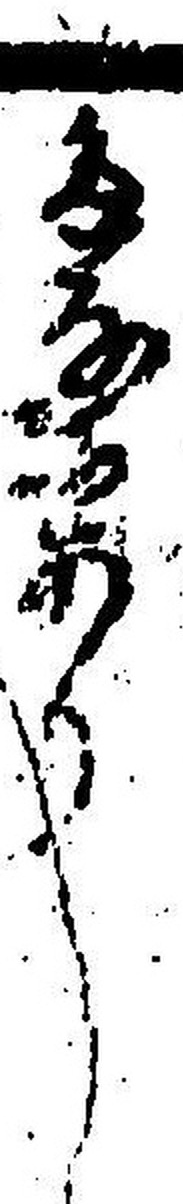たなにあり
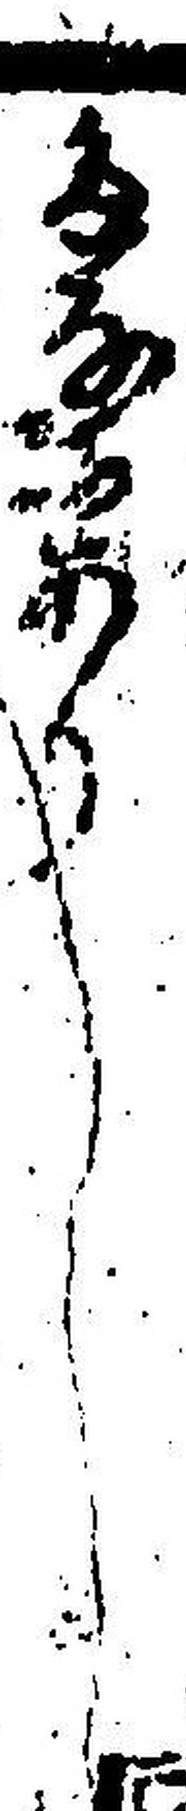たなにあり
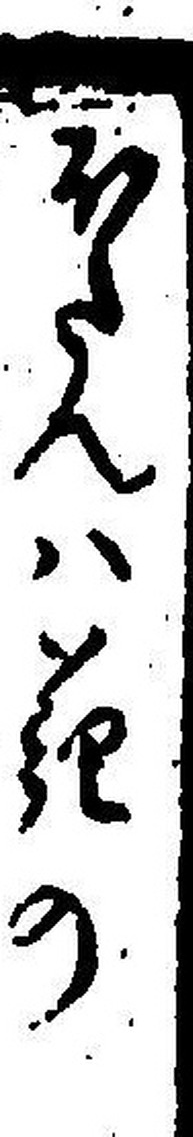ほたんは花の
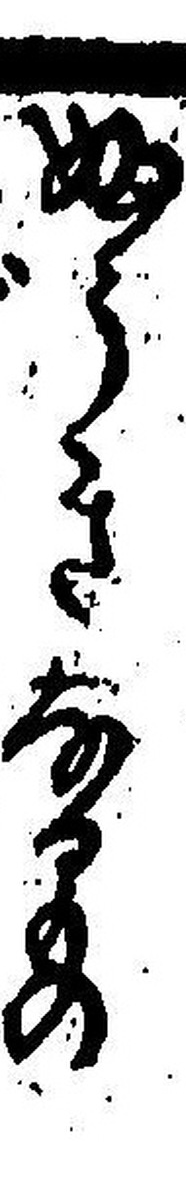ふうきなるもの
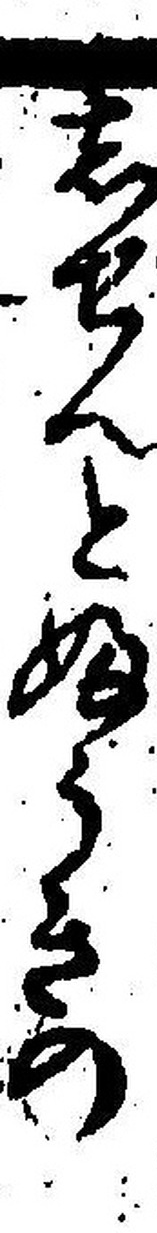しぜんとふうきの
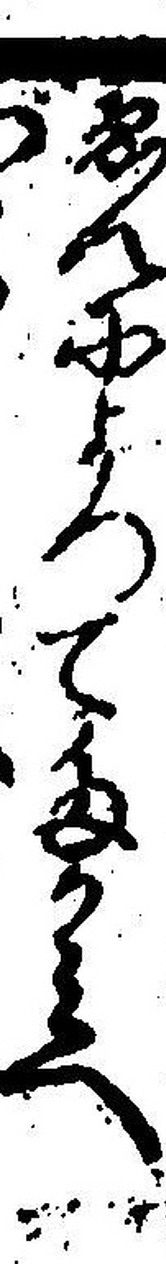ゑんによつてたかみへ
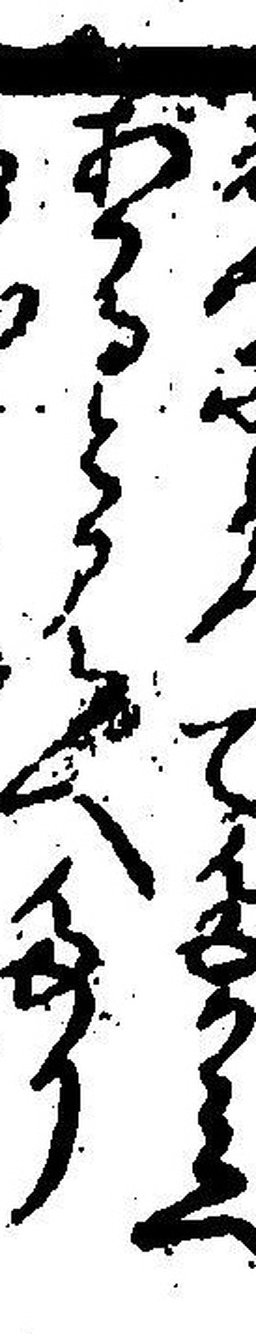あかると見へたり
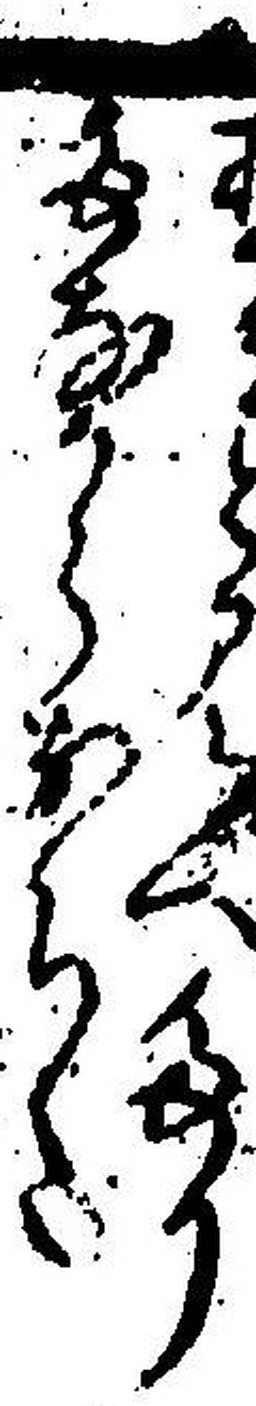たなからおちた
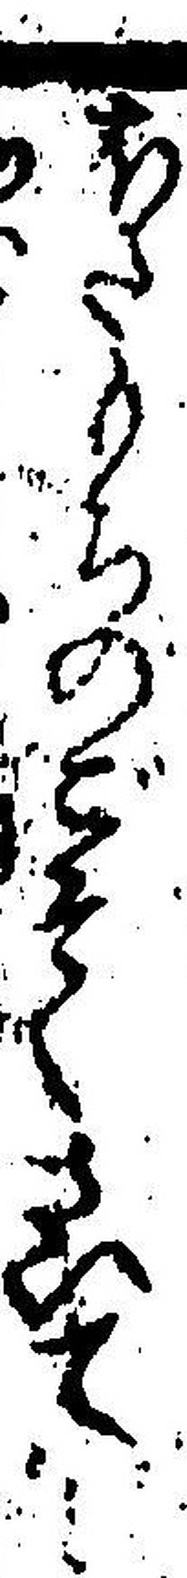ほたもちのごそくさいて
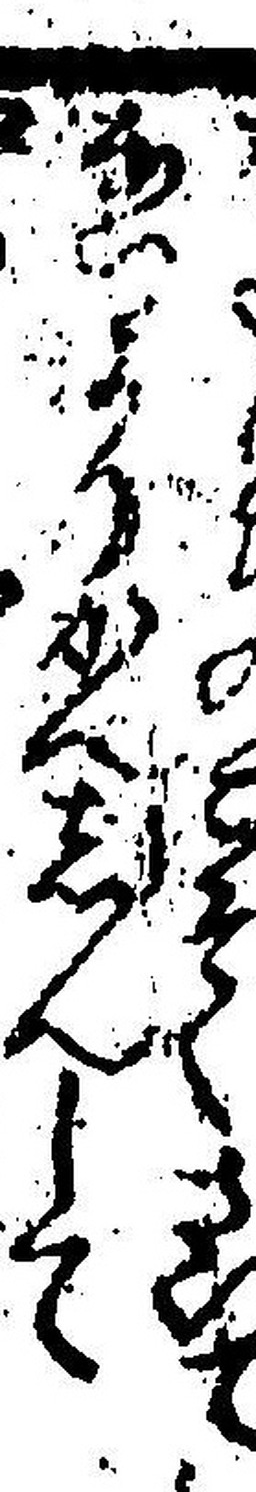ないよりかんしんして
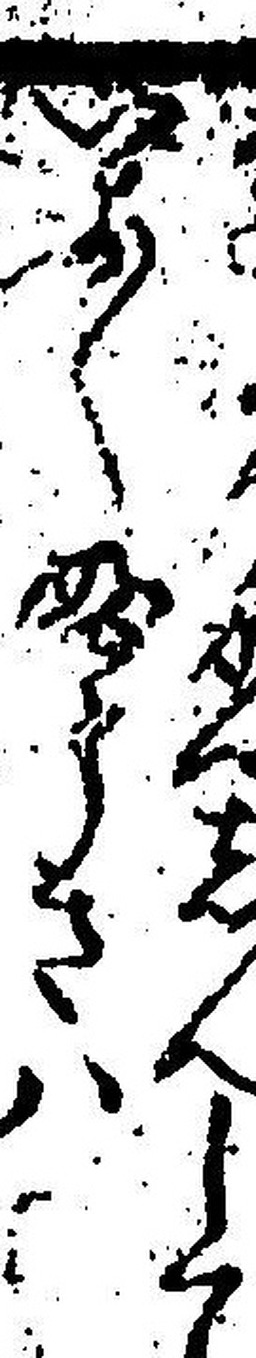いよ〳〵ふうきは
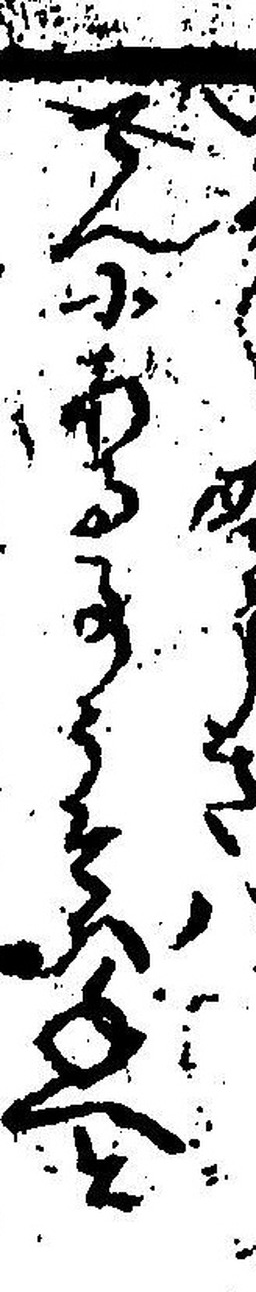てんにある事うそはねへと
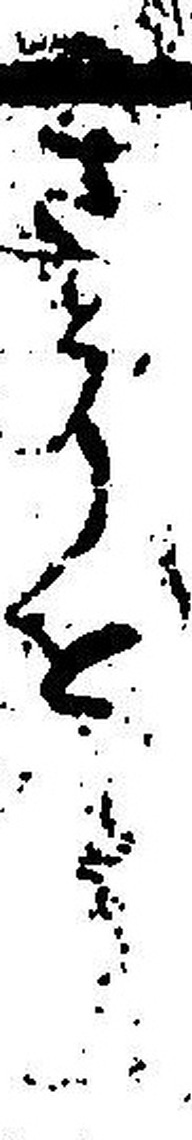さとりを
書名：牡丹餅棚有 / 市場通笑作
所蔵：東京大学総合図書館 General Library in the University of Tokyo, JAPAN
